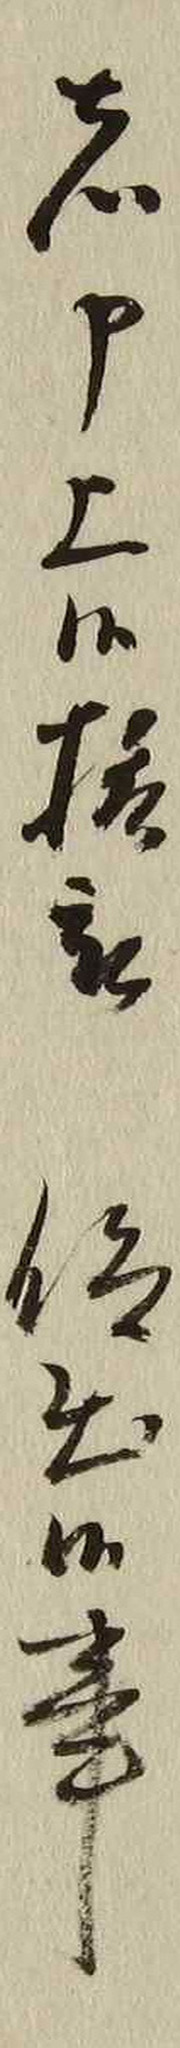者申上候様被仰出候事
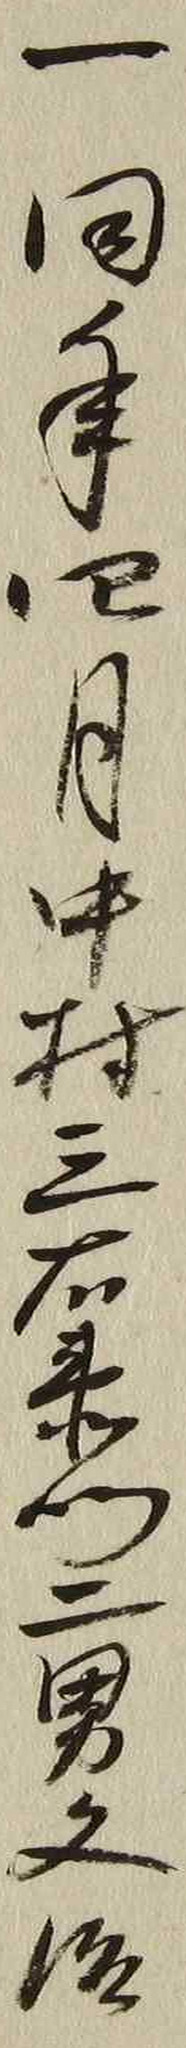一同年四月中村三右衛門二男又治
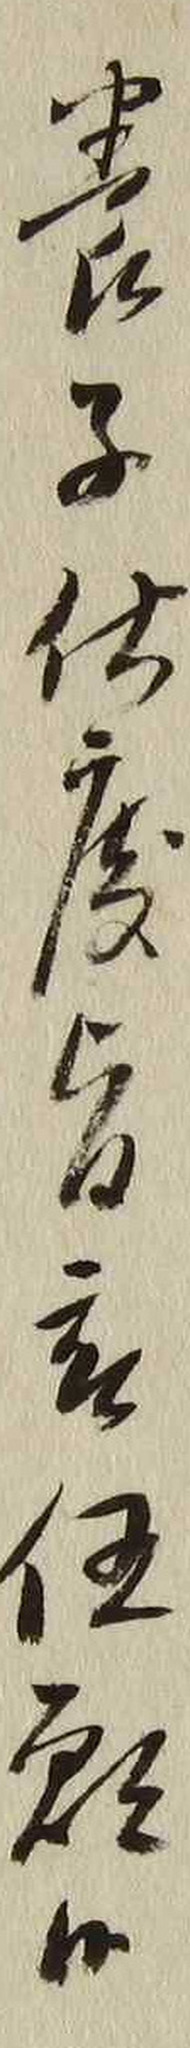養子仕度旨被任願候
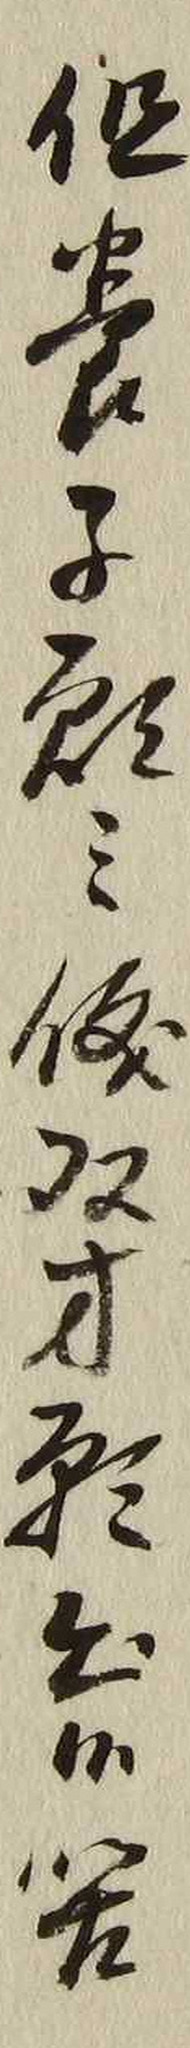但養子願之儀双方願出候筈
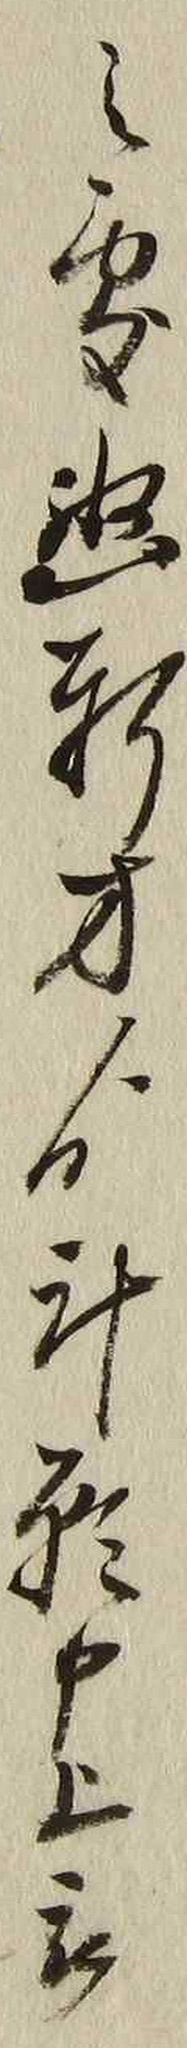之処幽軒方ゟ計願申上被
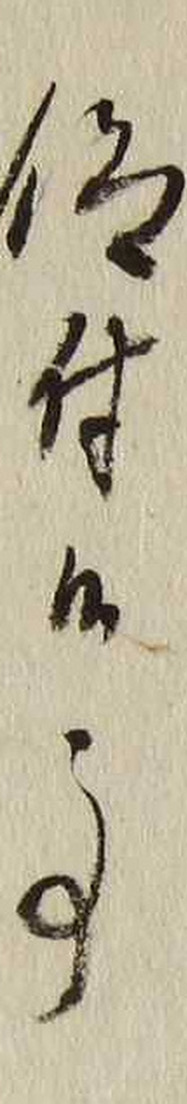仰付候事
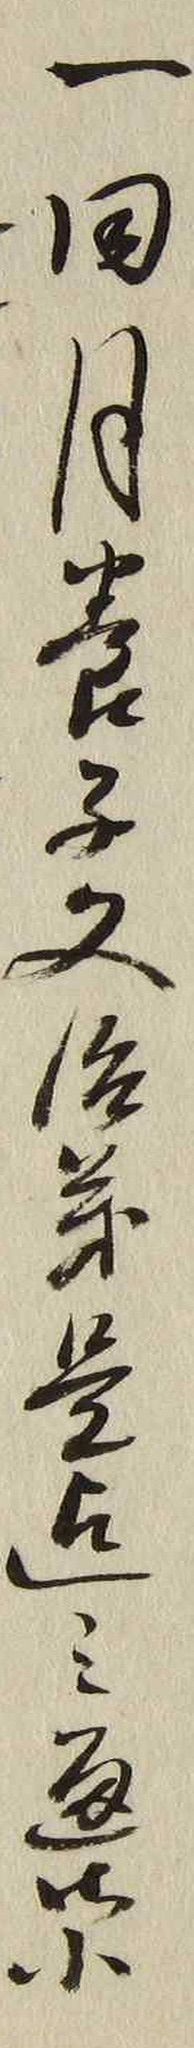一同月養子又治義是迄之通御小
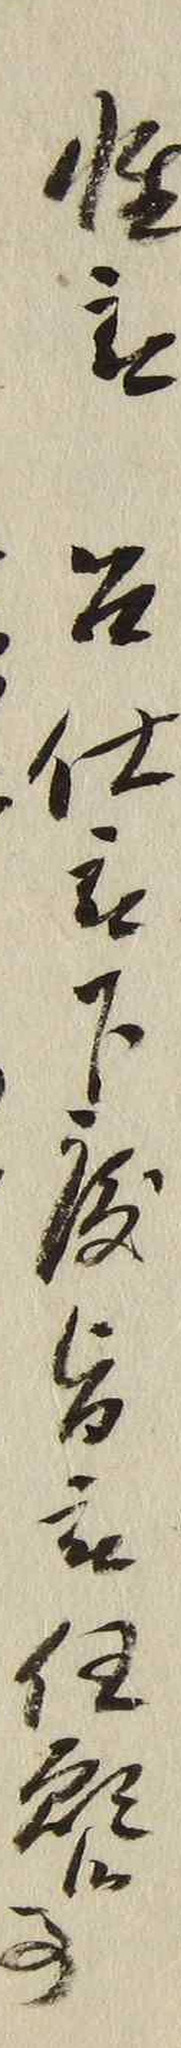性被召仕被下度旨被任願候事
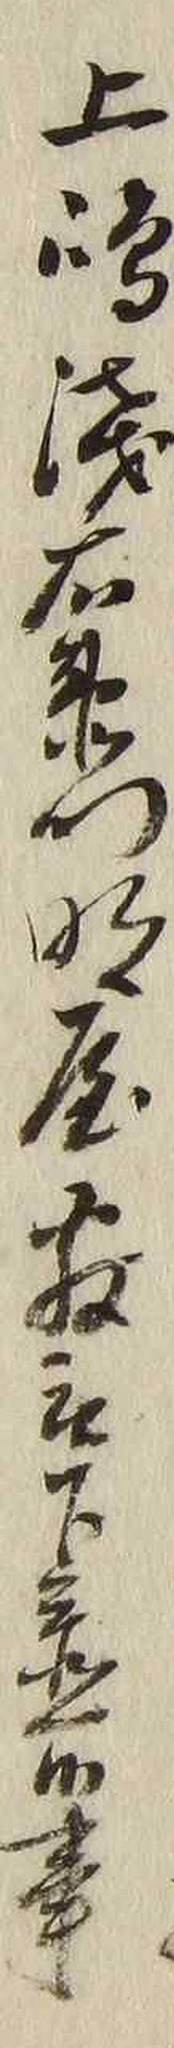一上島浅右衛門明屋敷被下置候事

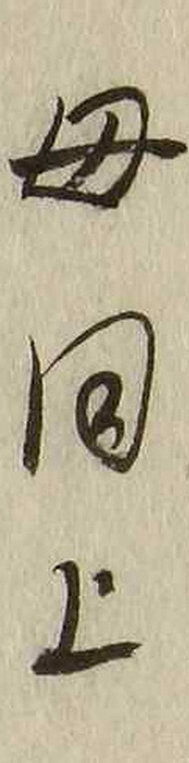母同上
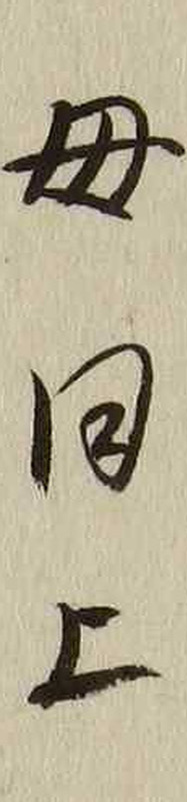母同上
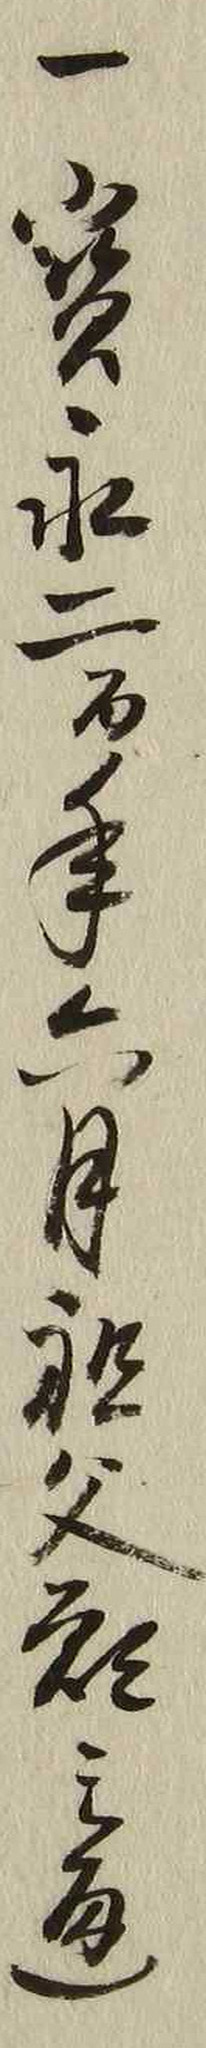一宝永二酉年六月祖父願之通
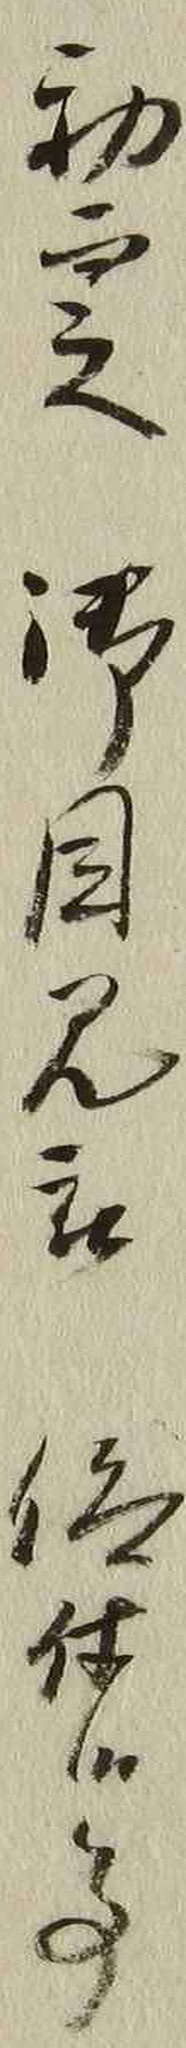初而之御目見被仰付候事
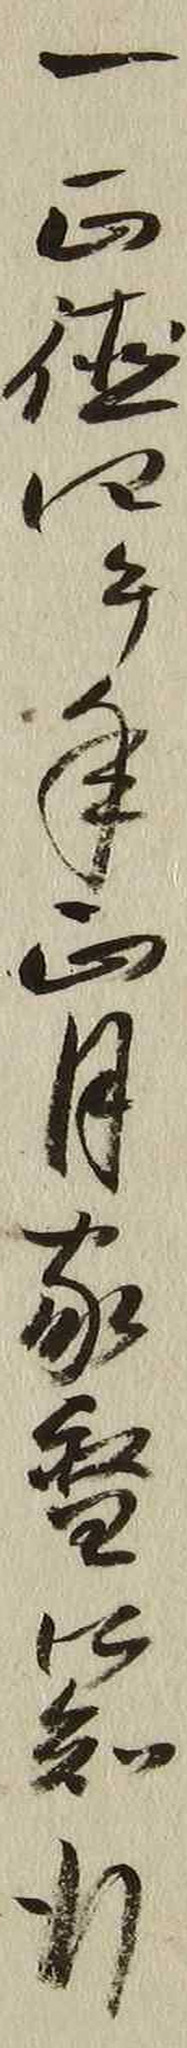一正徳四午年正月家督御知行
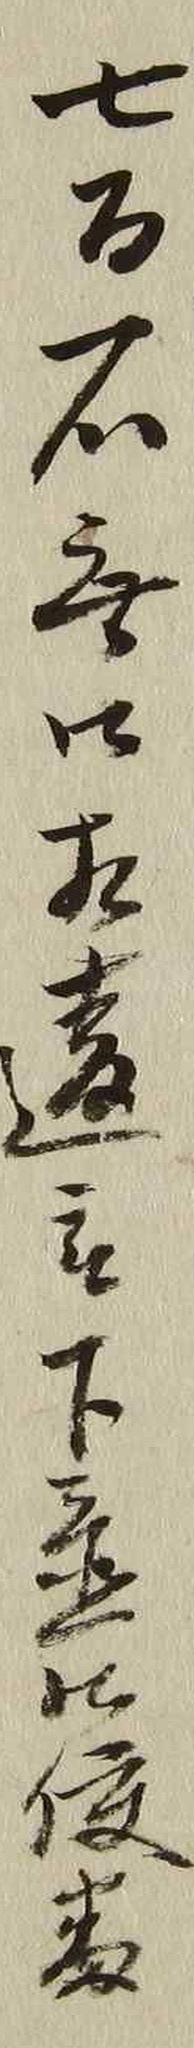七百石無御相違被下置御使番
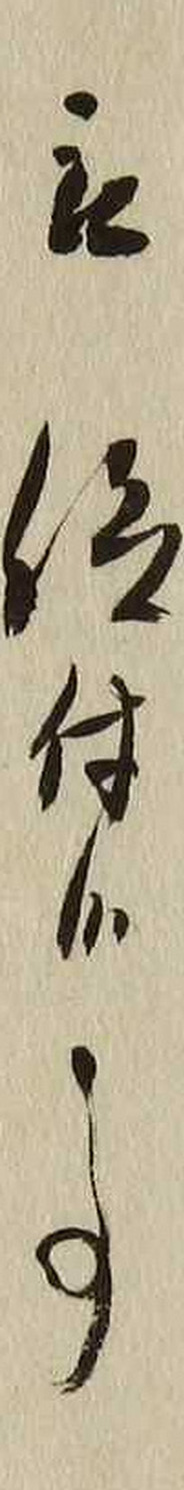被仰付候事
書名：諸士系譜　巻之355　す之部5
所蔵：会津若松市立会津図書館
